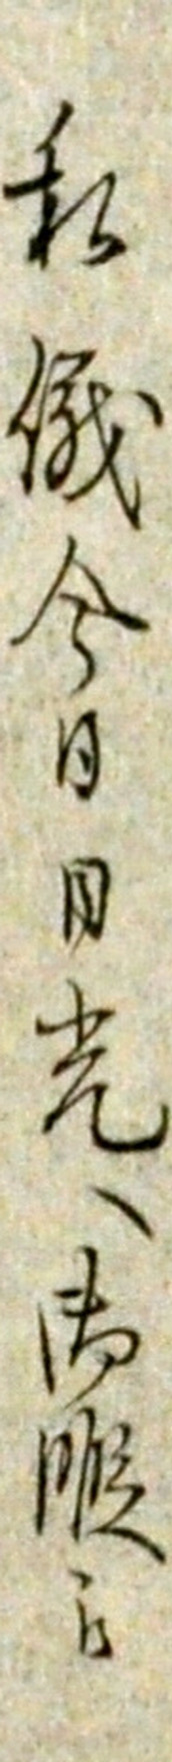私儀今日日光へ御暇被
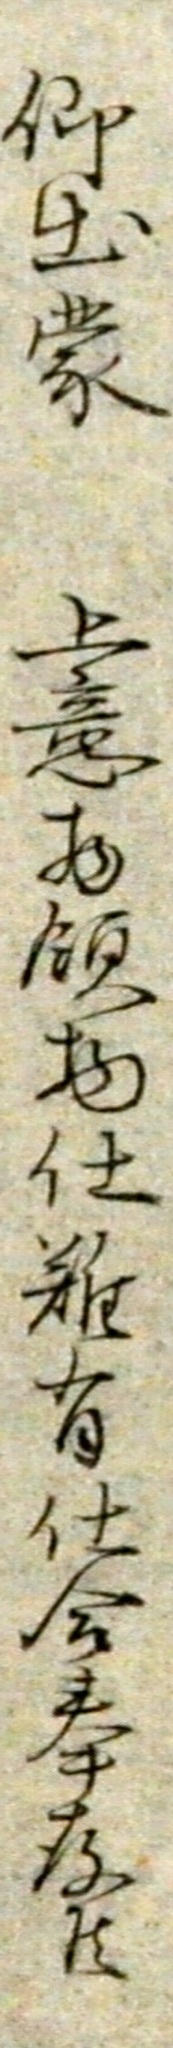仰出蒙上意拝領物仕難有仕合奉存候
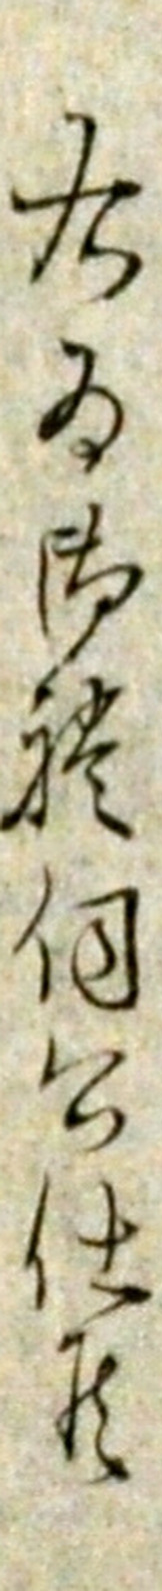右為御礼伺公仕候
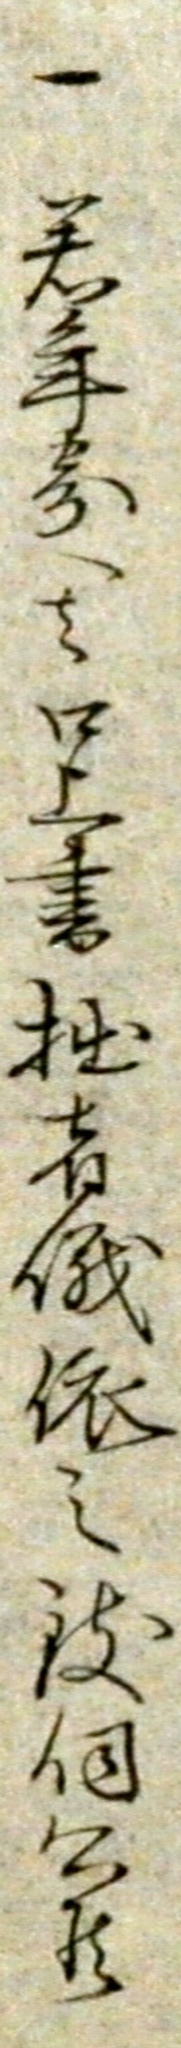一若年寄へは口上書拙者儀依之致伺公候
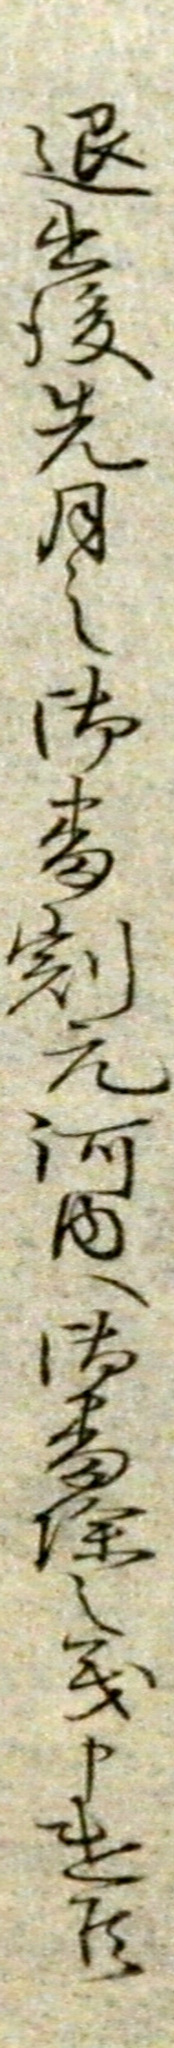一退出後先月之御番割元河内へ御番除之義申遣候

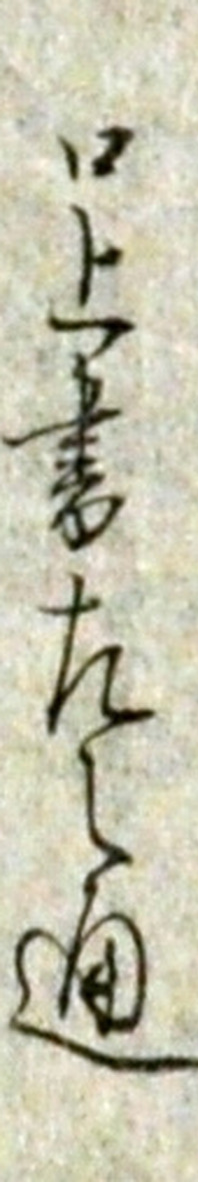口上書左之通
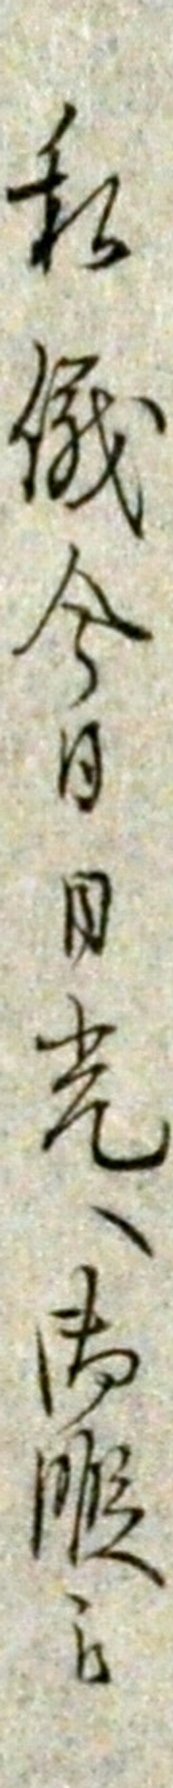私儀今日日光へ御暇被
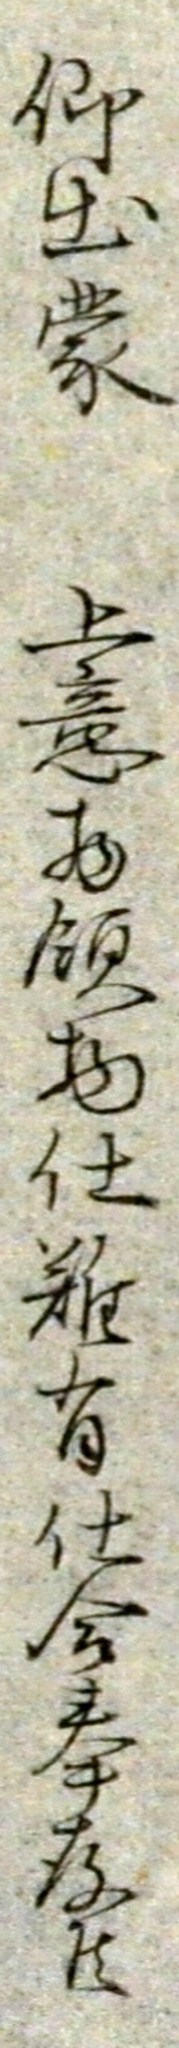仰出蒙上意拝領物仕難有仕合奉存候
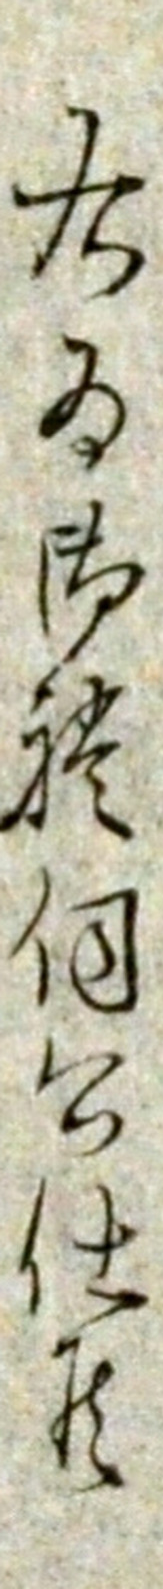右為御禮伺公仕候
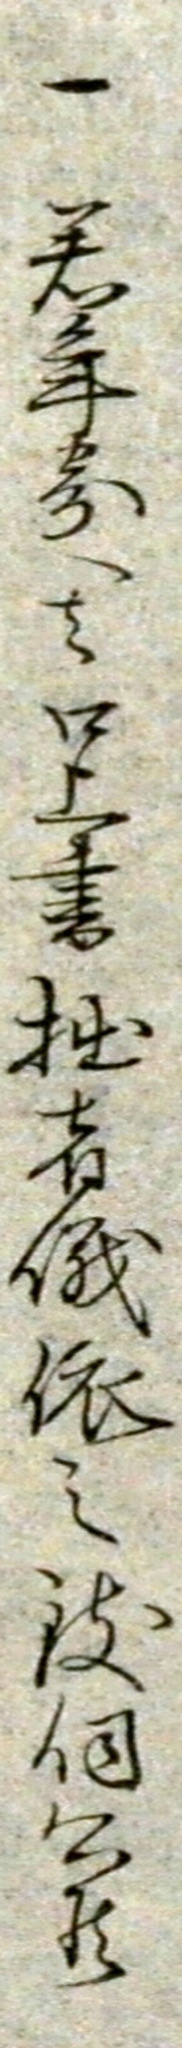一若年寄へ者口上書拙者儀依之致伺公候
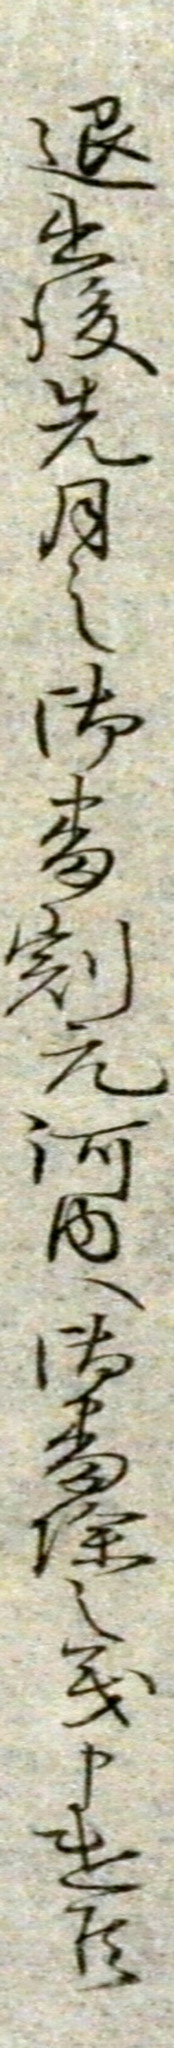一退出後先月之御番割元河内へ御番除之義申遣候
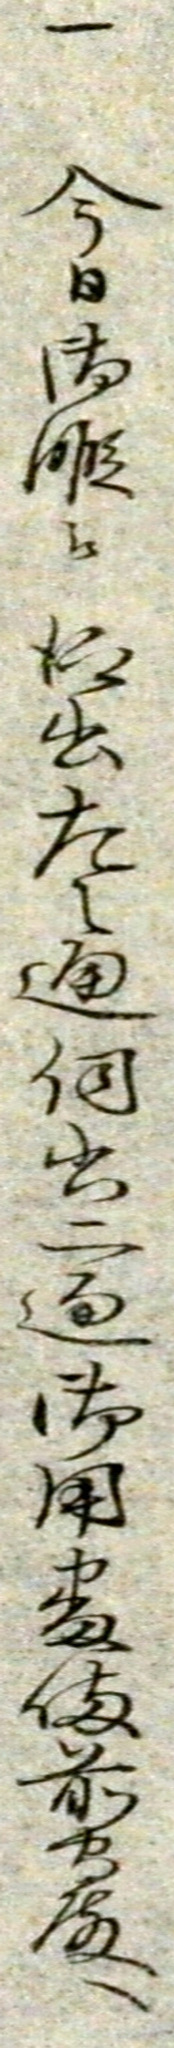一今日御暇被仰出左之通伺書二通御用番備前守殿へ
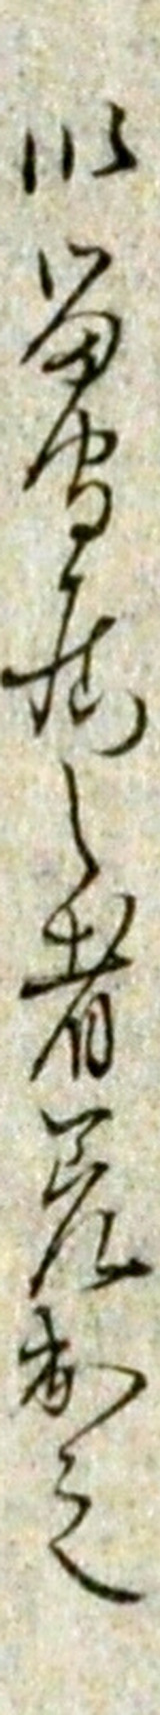以留守居之者差出之
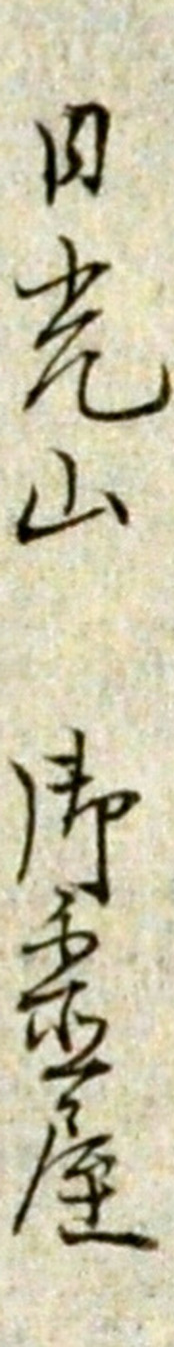日光山御霊屋
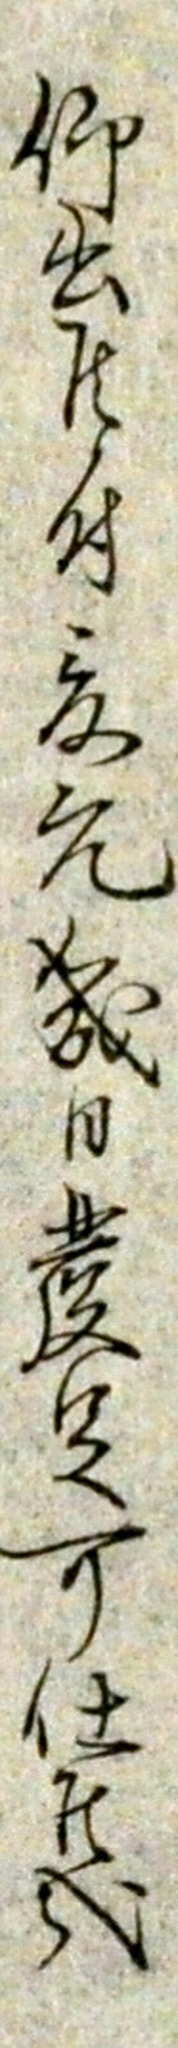仰出候付爰元幾日発足可仕候哉
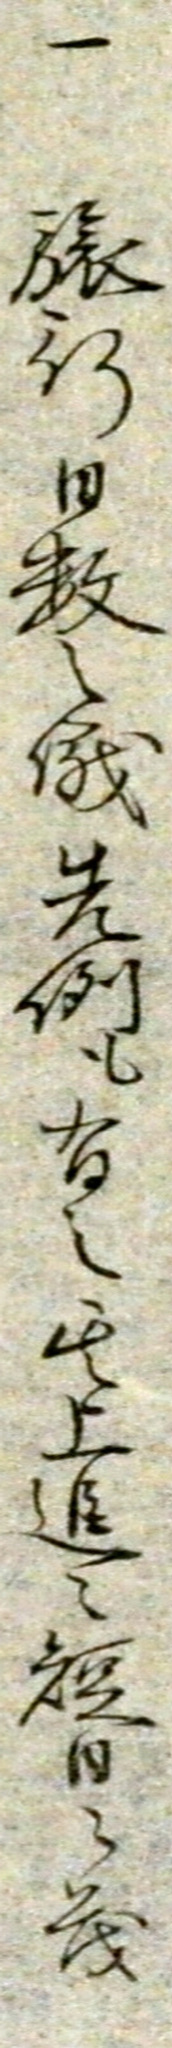一旅行日数之儀先例も有之其上追々短日にも
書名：日光御名代相勤候節ノ留
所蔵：伊那市立高遠町図書館・合同会社AMANE
